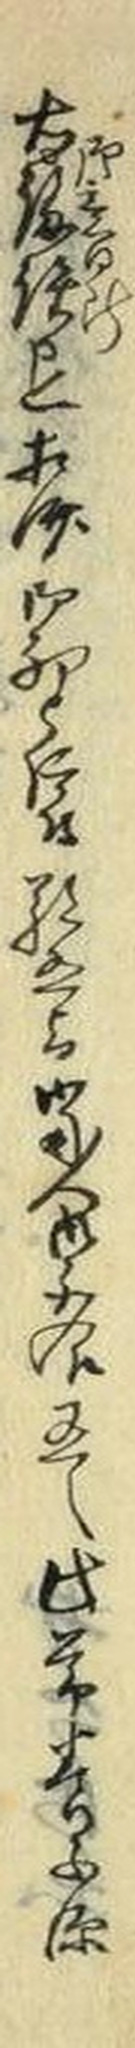右〇御意同断講談申上相済御初被仰付難有旨御用人御取合有之此節養子源
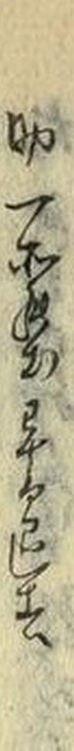助一所罷出畢而退去
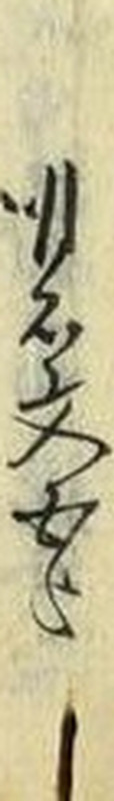明石文五郎
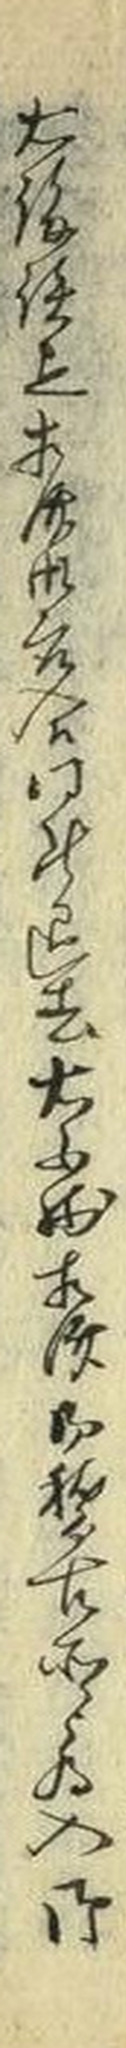右講談申上相済御取合同断退去右不残相済御稽古所へ被為入御
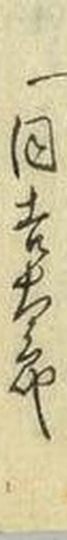同源太郎
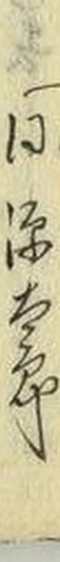同源太郎
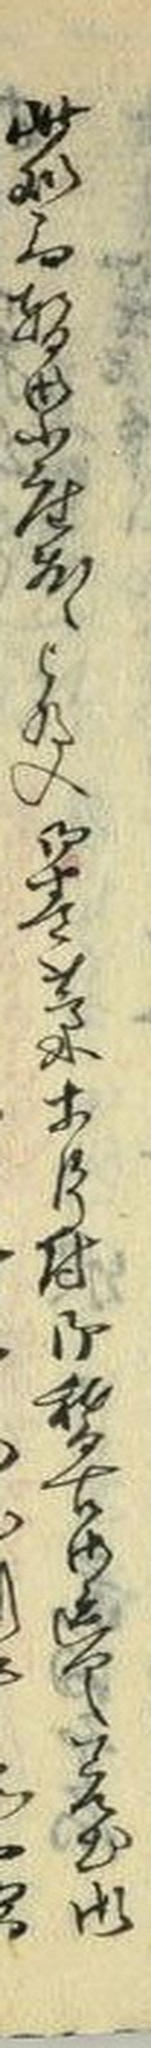時刻ニ而暫御小座敷へ被為入御巻藁等片付御稽古御道具差出御
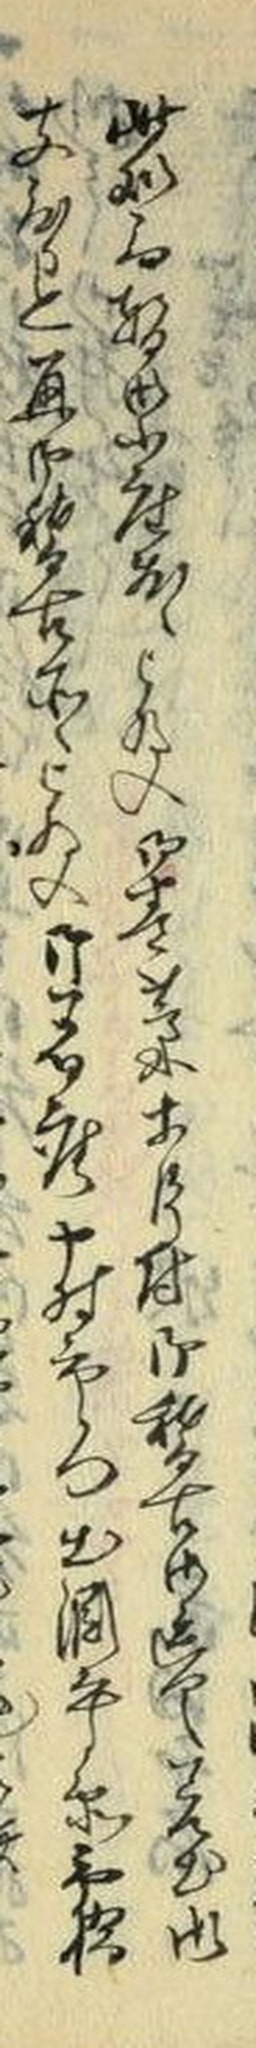支度申上再御稽古所へ被為入御着座中村市右衛門出淵平兵衛市橋
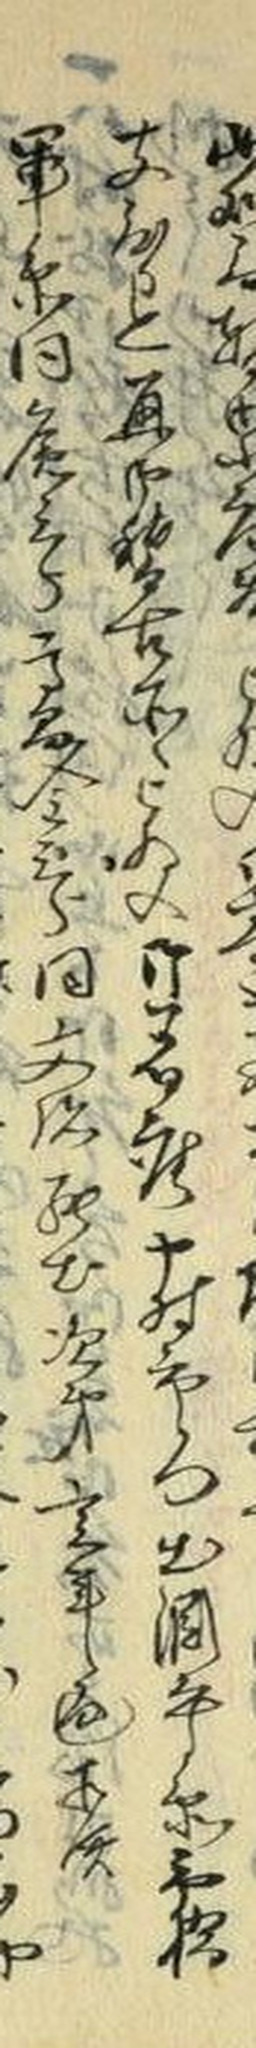軍兵衛廉三郎高畠金三郎同文弥罷出次第亥年之通相済
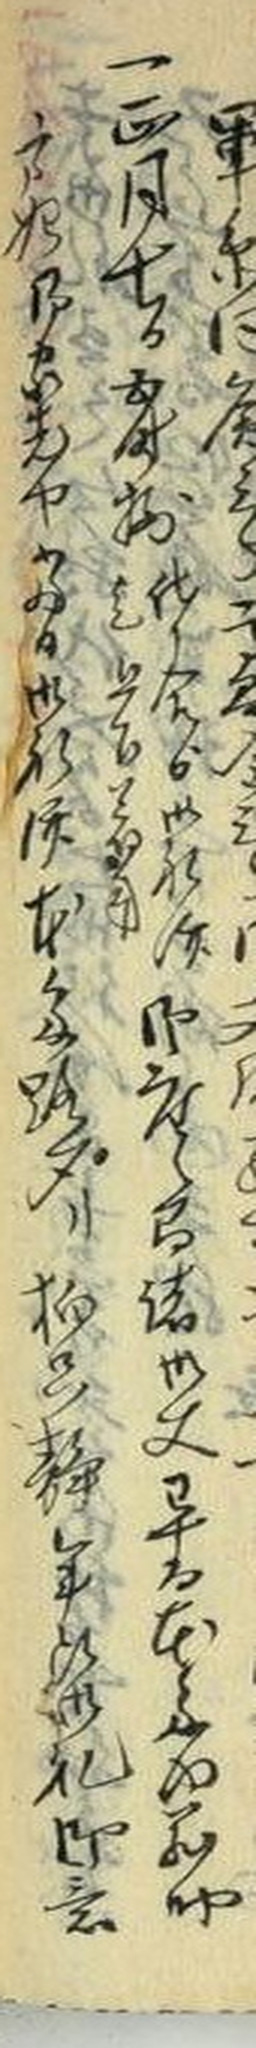方始御家老中当日御礼済本多路夕引狛只静年頭御礼御意
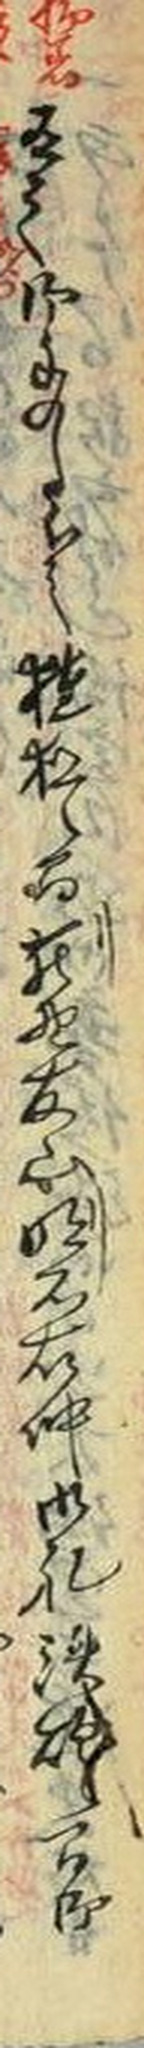有之御手のし被下之韃靼之間荻野友山明石右仲御礼鉄炮之間御
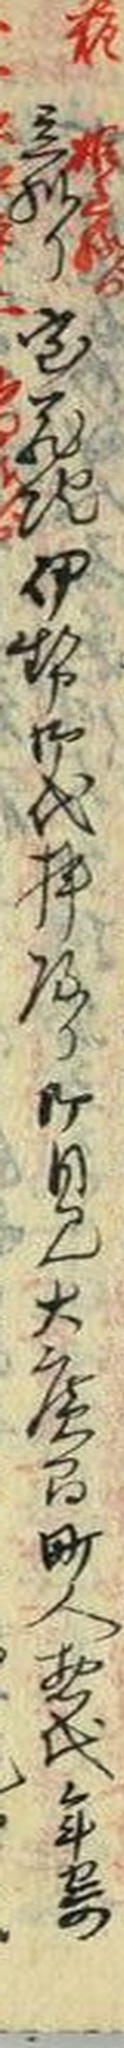立掛り宝蔵院伊勢御代拝帰り御目見大広間町人惣代年寄
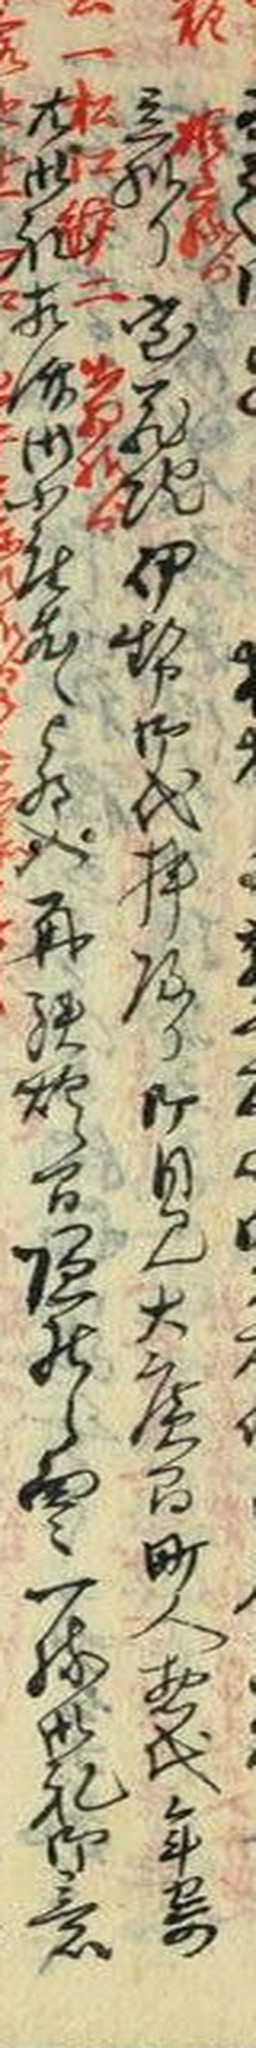共御礼相済御小座敷へ被為入再鉄炮之間隠居之面々一統御礼御意
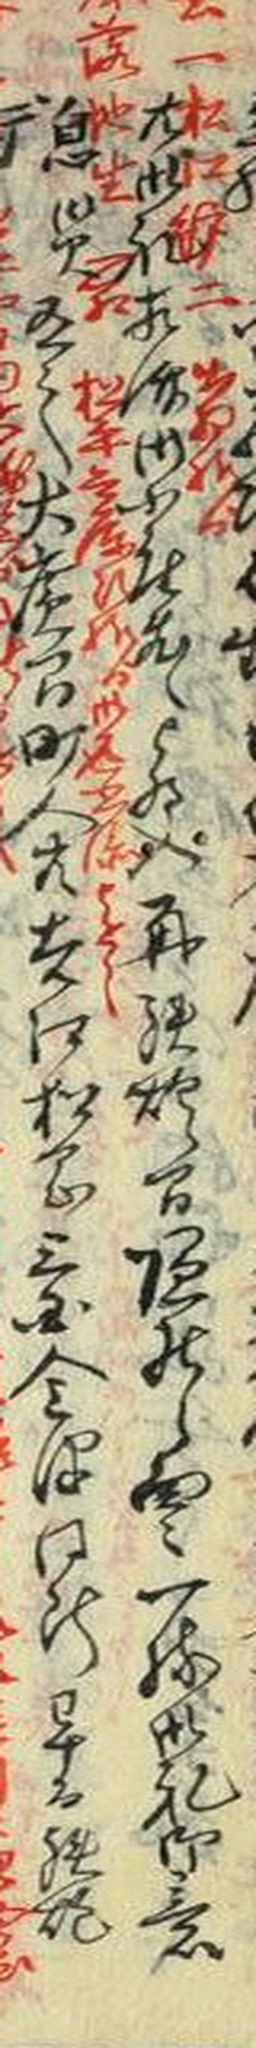デ有之大広間町人共吉江松岡三国金津同断畢而鉄炮
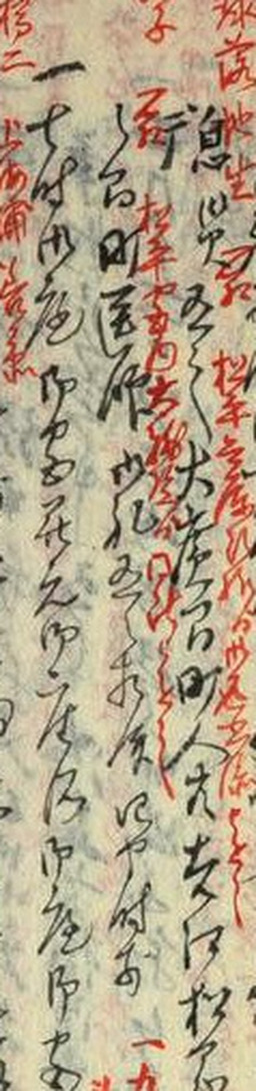之間町医師御礼有之相済四半時前
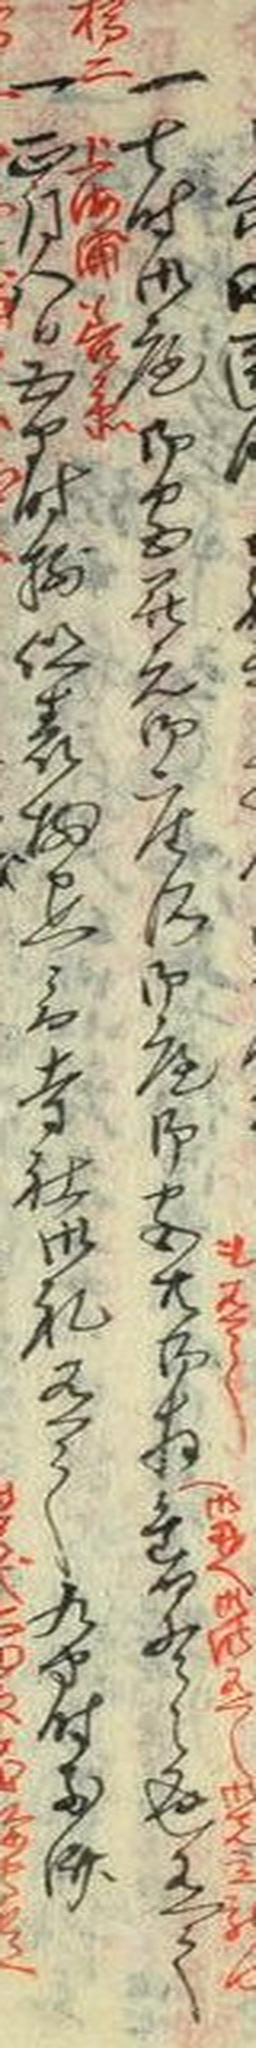一正月八日五半時揃但表揃申上ニ而寺社御礼有之九半時前済
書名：少傅日録抄（斉承付側向頭取日記、在国）
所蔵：福井県文書館 Fukui Prefectural Archives
